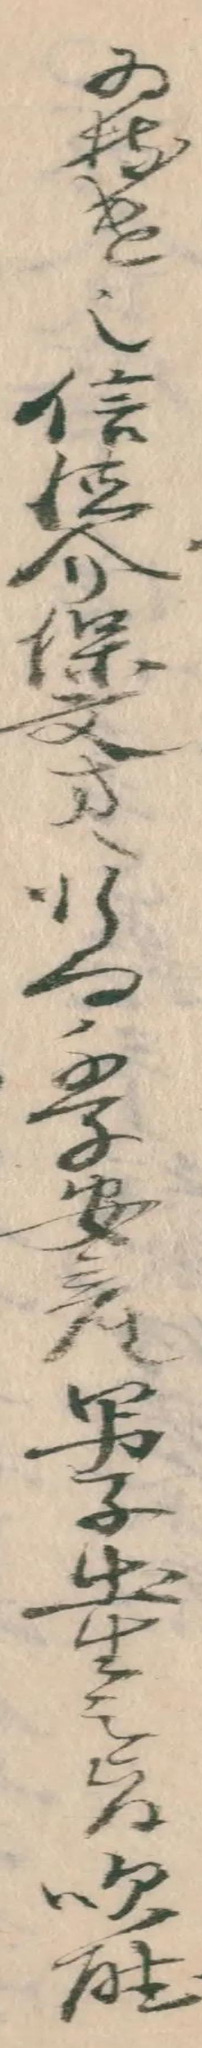為持遣也信濃介保文方へ行向千子安産男子出生之旨吹聴
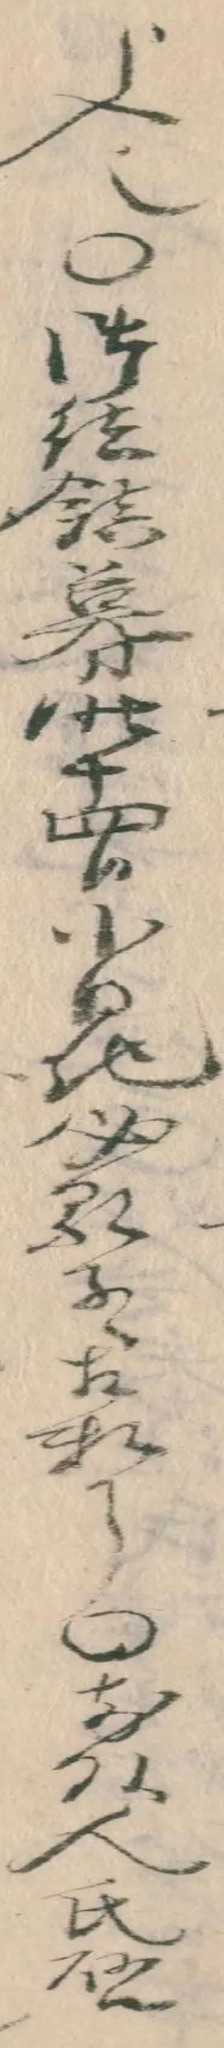申入也○御結鎮募昨十四日小日記必顕子へ相頼了○前頭人氏啓
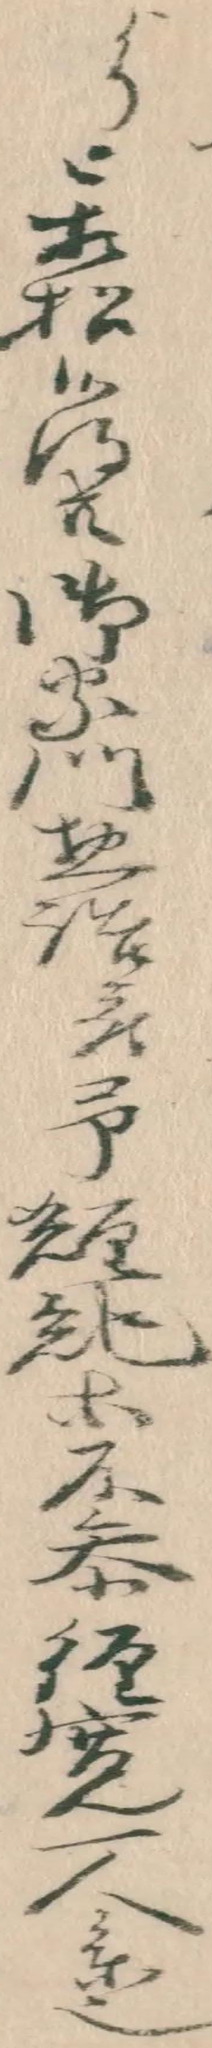より被相招候得共御家門惣詰ニ付予経紀等不参経寛一人参也
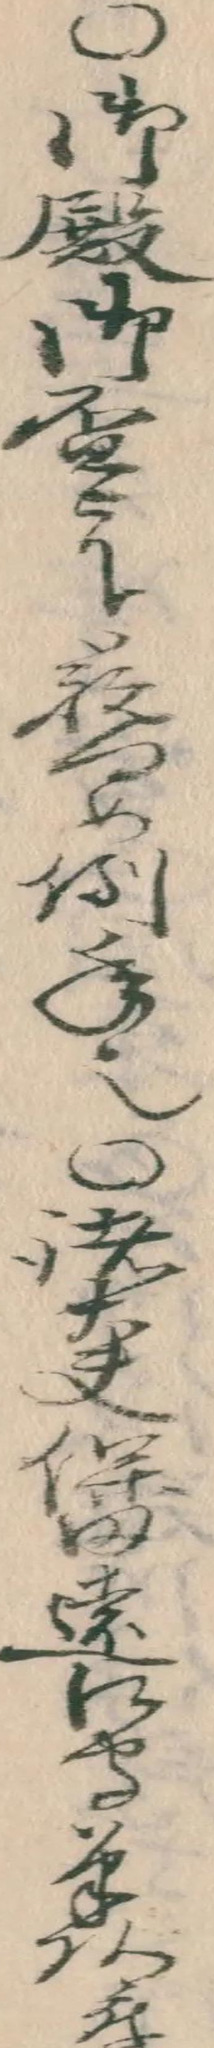○御殿御盃被下御祝向如例年也○諸大夫保田遠江守筆頭ニ付
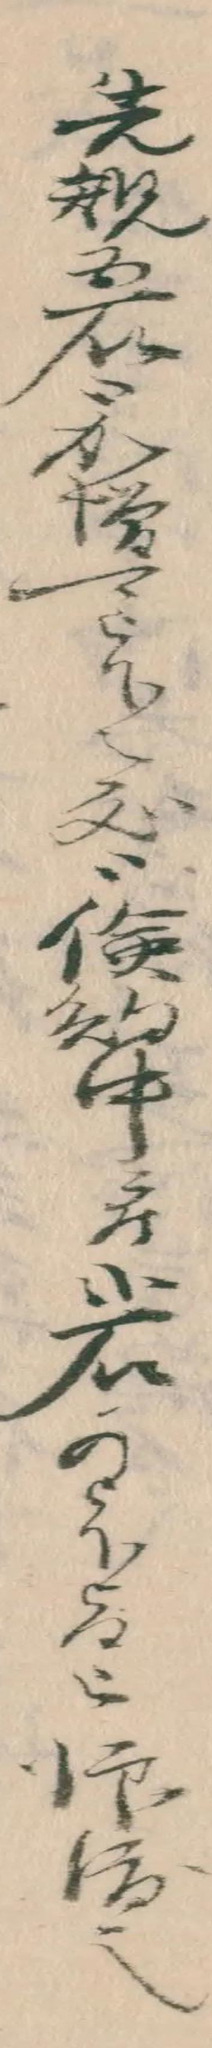先規五石御加増可被下之処御倹約中ニ付弐石可被被下旨被仰渡也
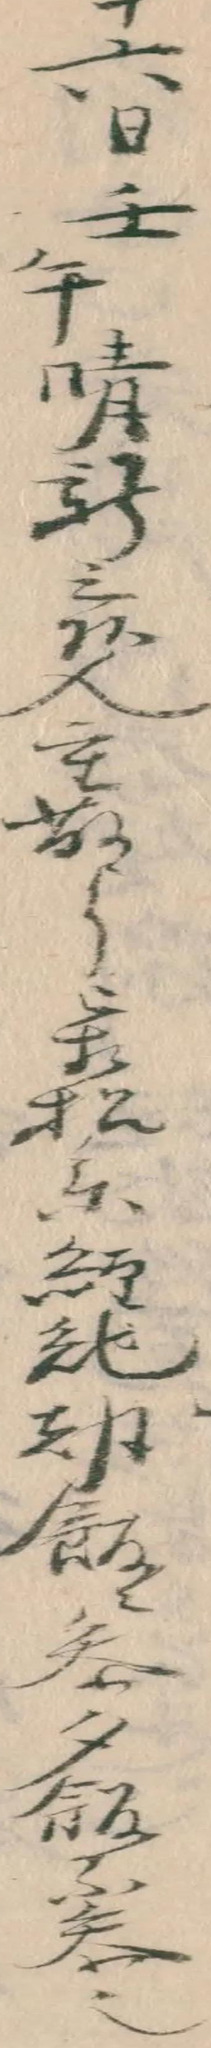十六日壬午晴新三頭人重散より被相招参経紀朝飯ニ参夕飯不参也
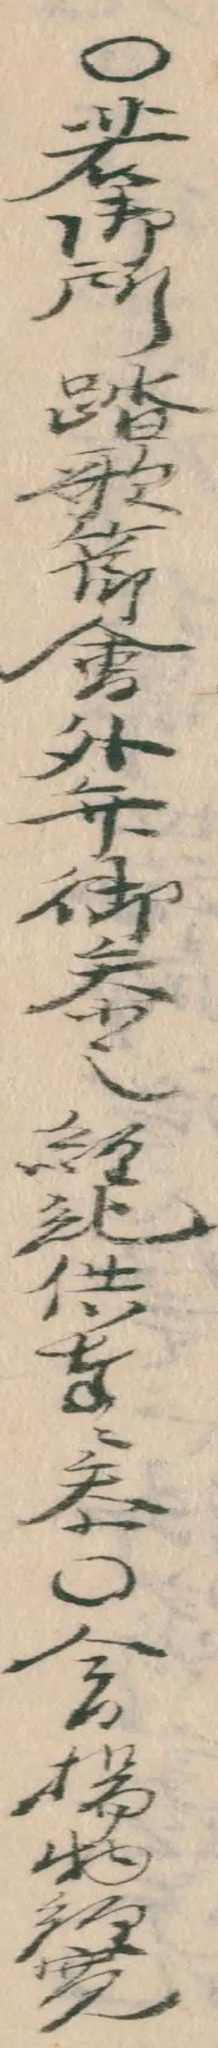○若御所踏歌節會外弁御参也経紀供奉ニ参○今日揚物経覚
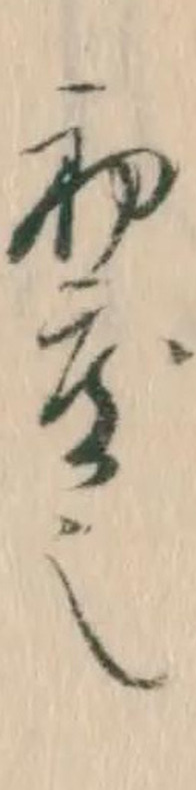初度也
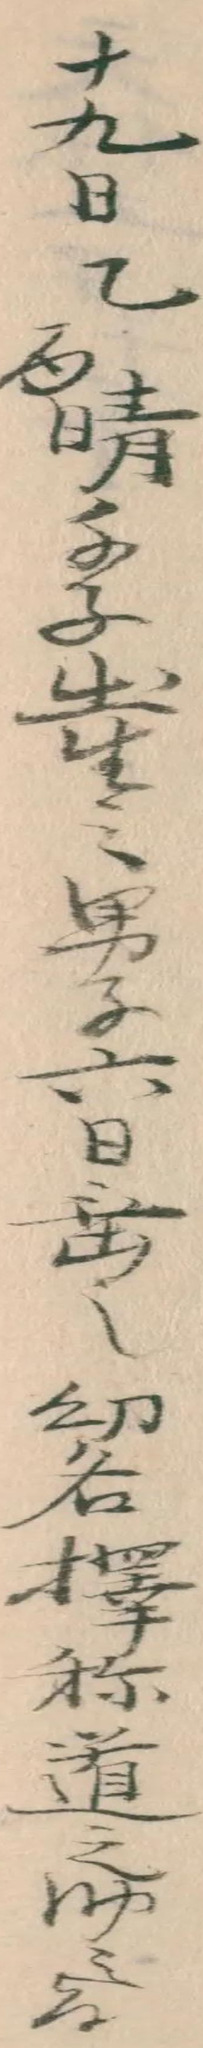十九日乙酉晴千子出生之男子六日歯也幼名擇称道之助之旨
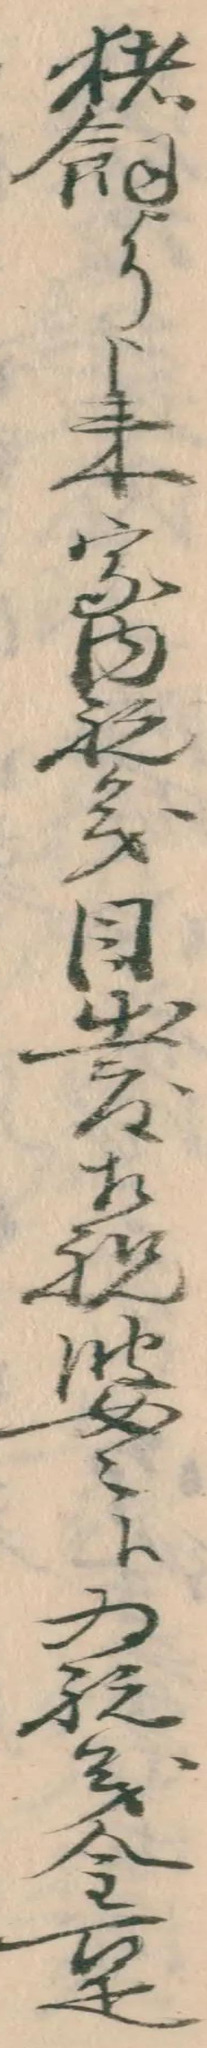猪飼より申来家内祝義目出度相祝婆々え為祝義金百疋
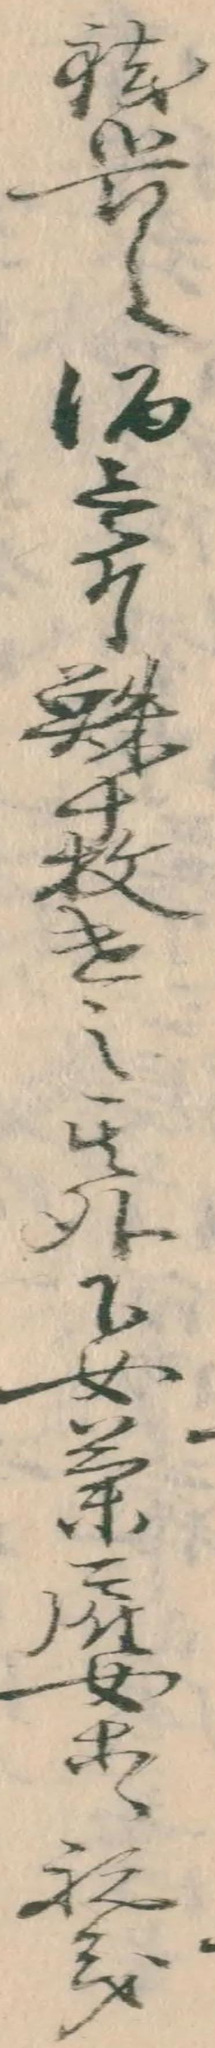銭弐百文酒壱升鮢十枚遣之其外下女菊雇女等へ祝義
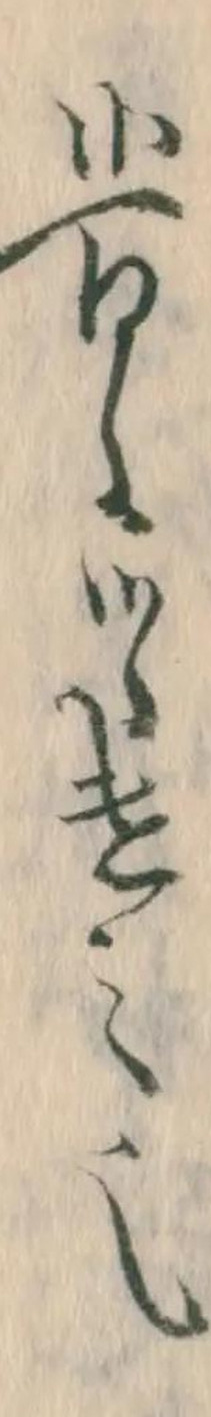弐百疋ツヽ遣之也
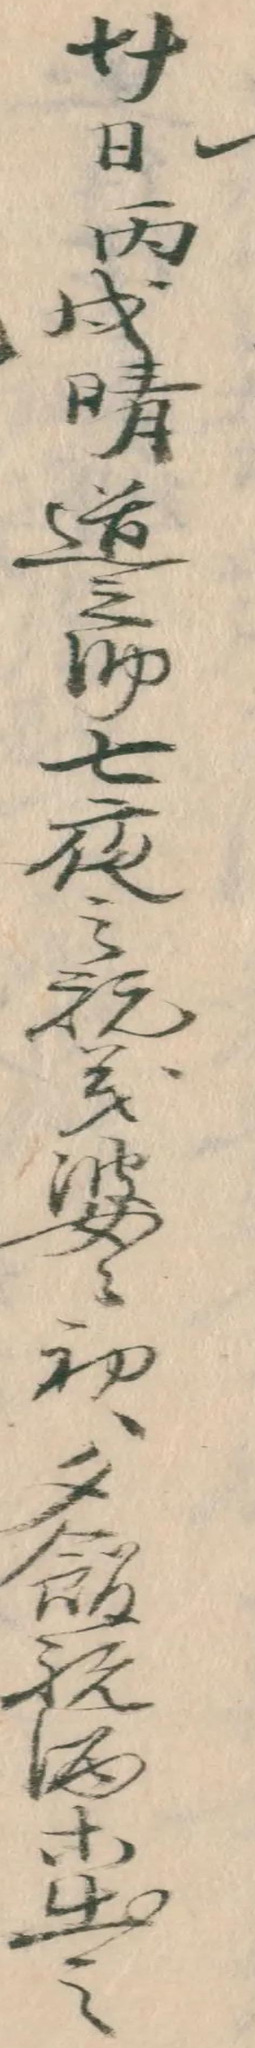廿日丙戌晴道之助七夜之祝義婆々初へ夕飯祝酒等出之
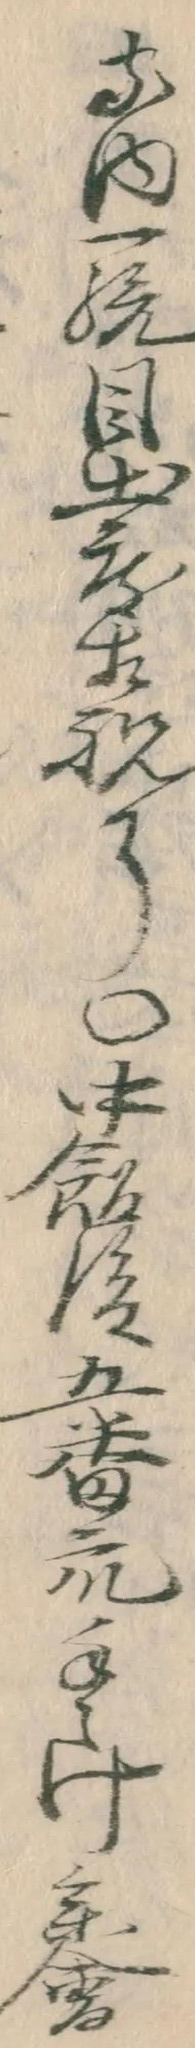家内一統目出度相祝了○中飯後五番衆手之汁参會
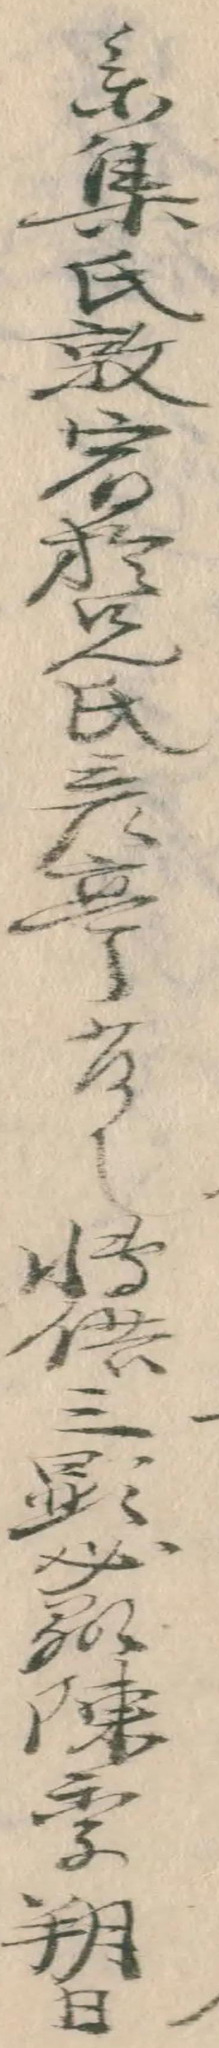参集氏敦宿於兄氏彦亭有之轉供三顕必顕陳季朔日
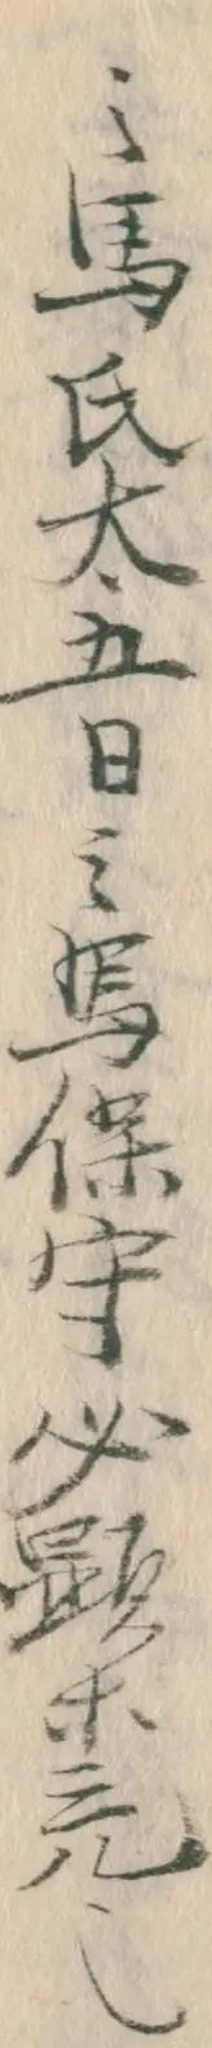之馬氏太五日之馬保守必顕等充也
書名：賀茂社記録. 第66冊
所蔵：国立国会図書館 National Diet Library, JAPAN
